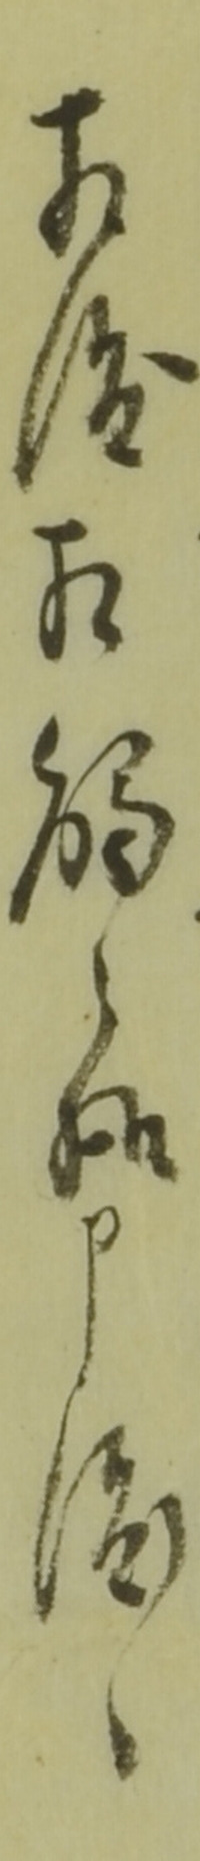相渡相触候様申渡候

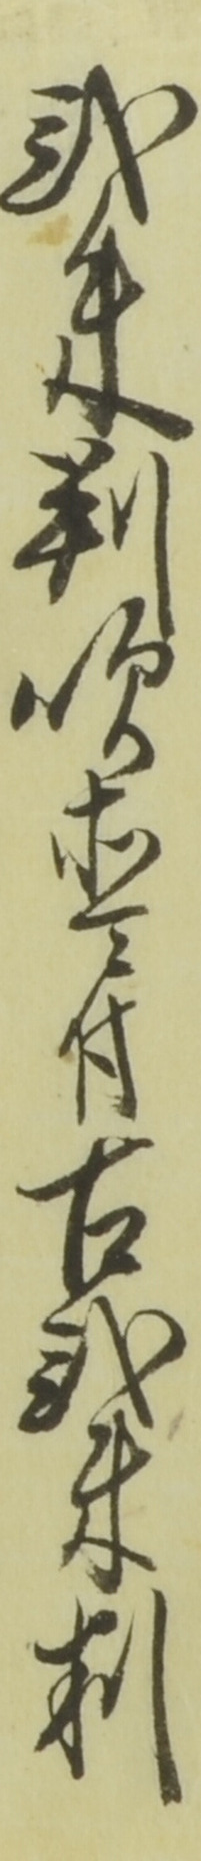弐朱判吹直ニ付古弐朱判
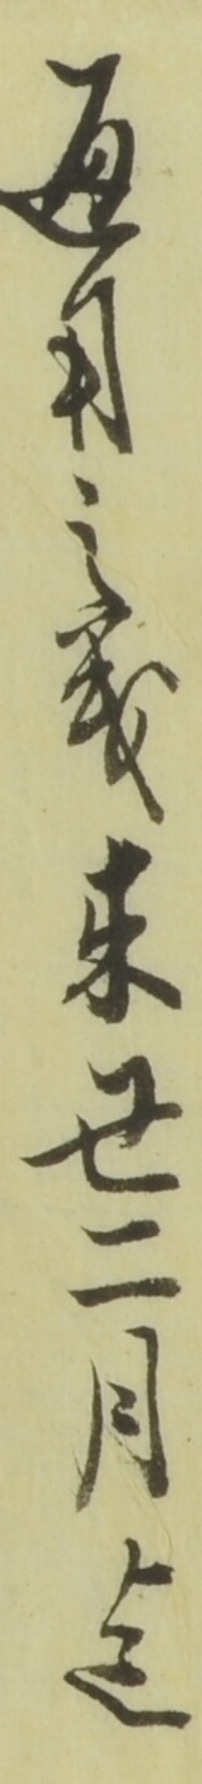通用之義来丑弐月迄
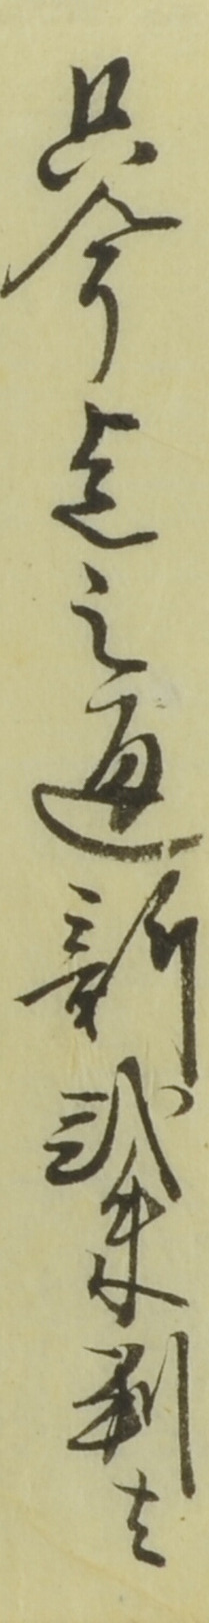只今迄之通新弐朱判は
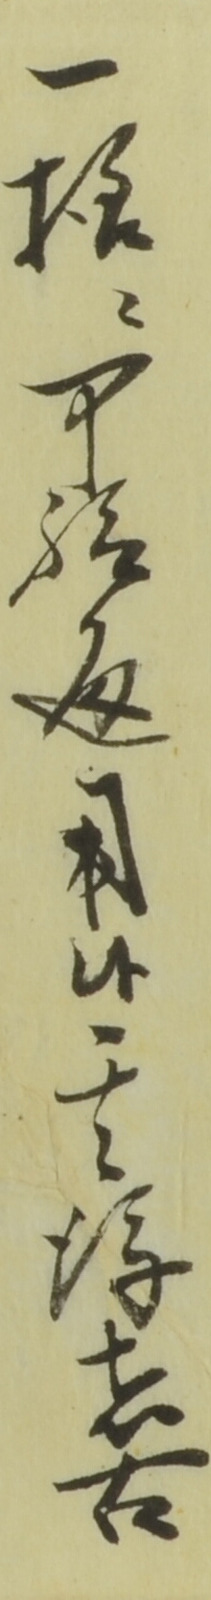一様ニ可給通用候其後は古
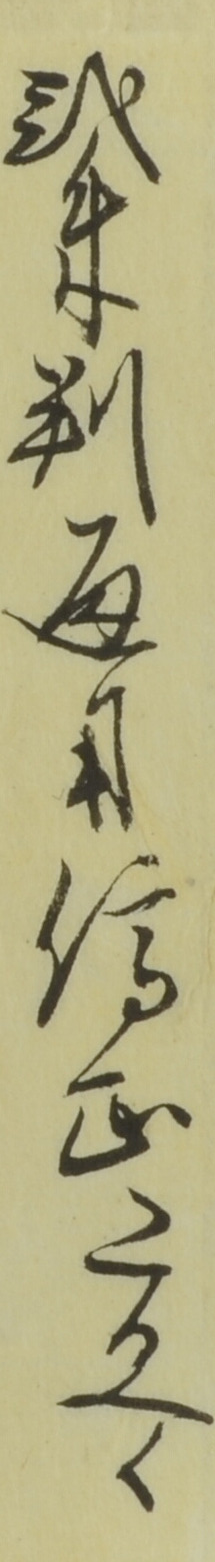弐朱判通用停止たるへく
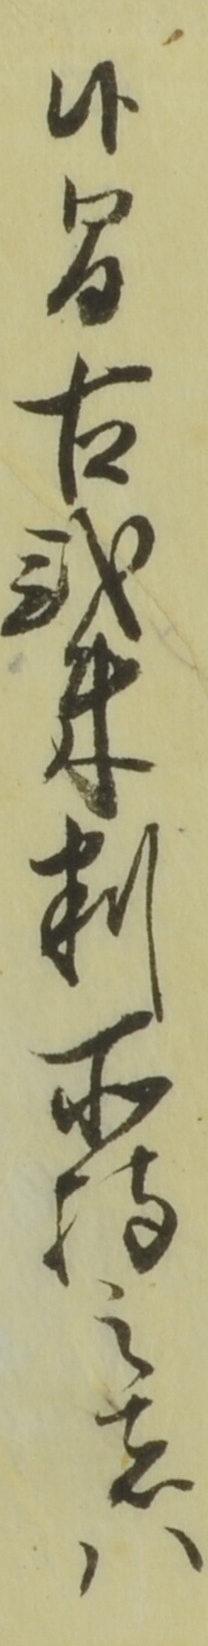候間古弐朱判所持之者ハ
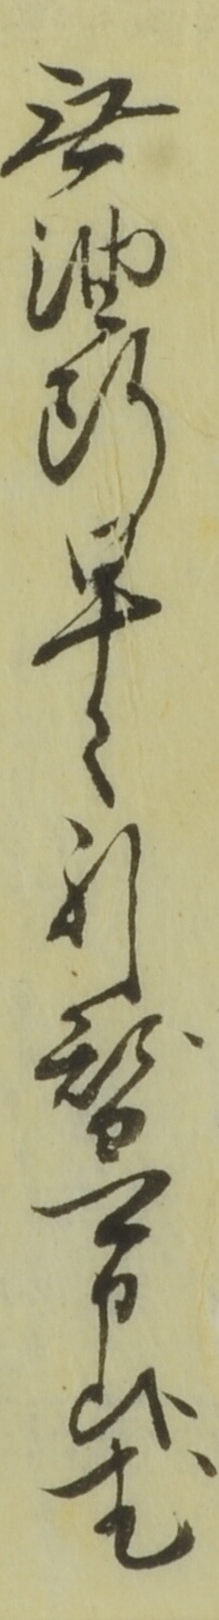無油断早々引替可申候尤
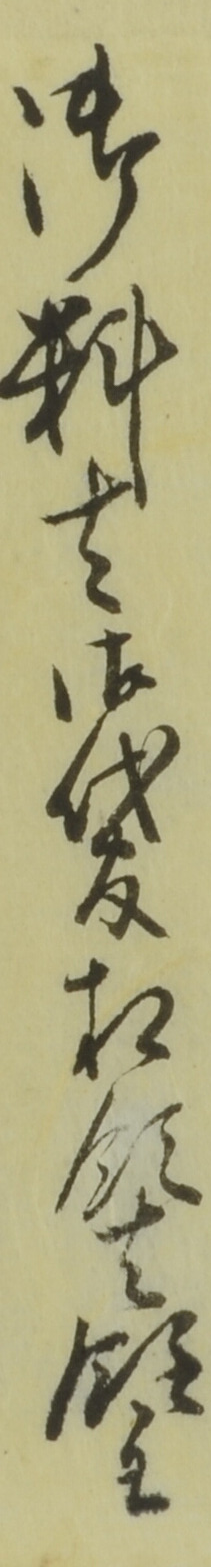御料は御代官相願は領主
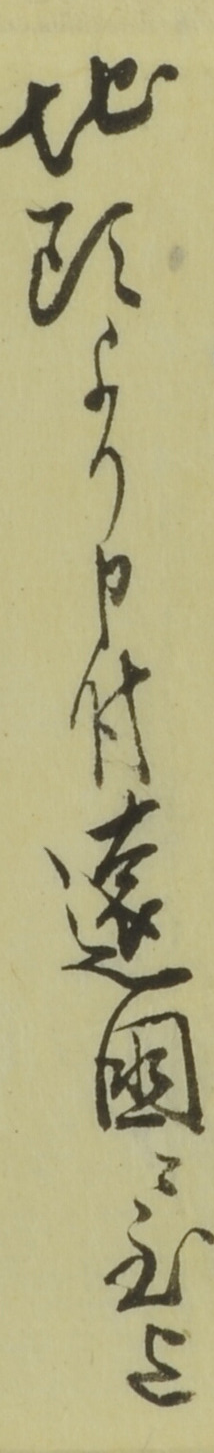地頭より申付遠国ニ至迄
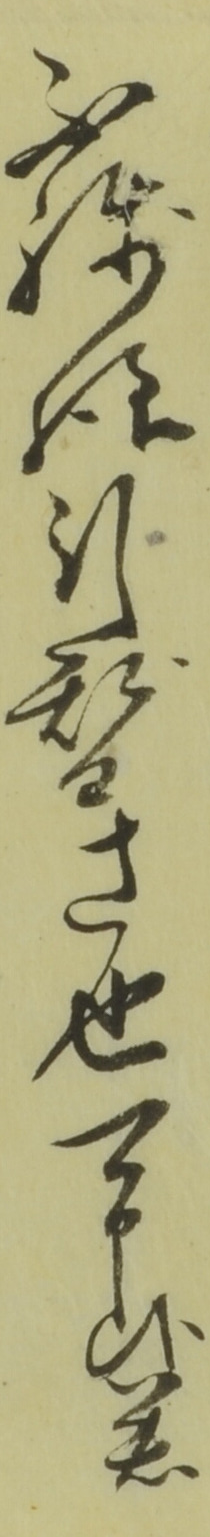不残様引替させ可申候若
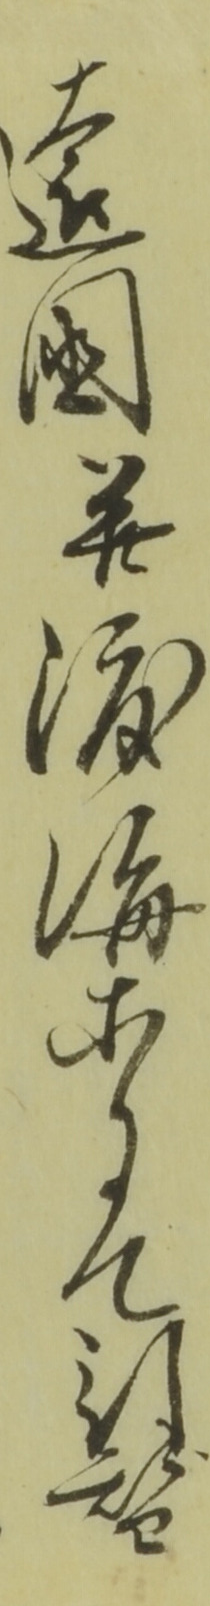遠国并渡海等にて引替
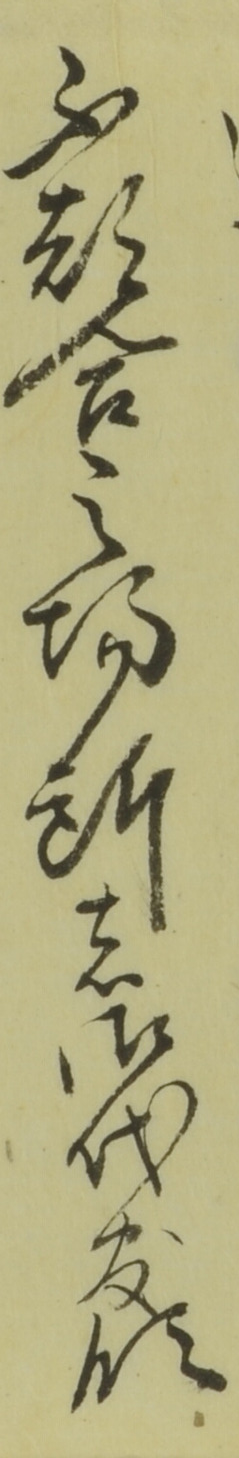不都合之場所は御代官領
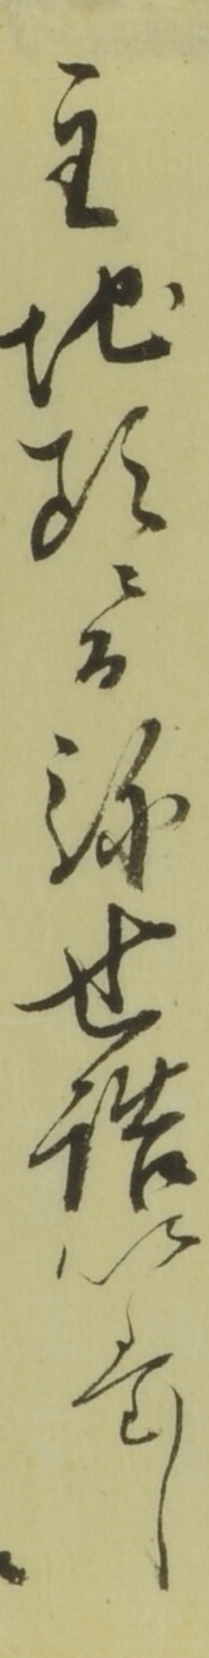主地頭ニ而弥世話いたし
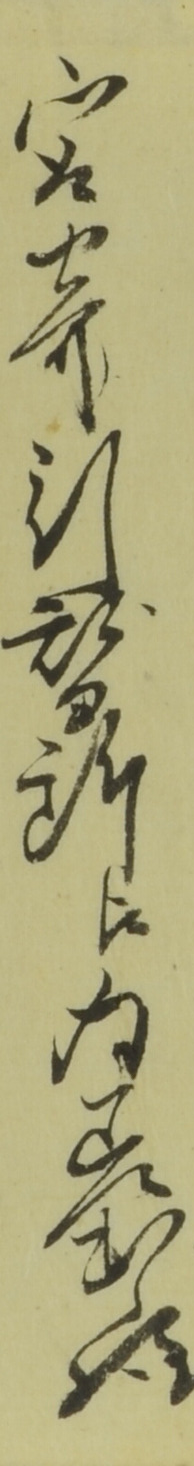最寄引替所江為差出候様
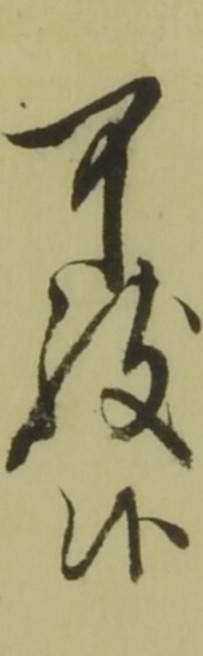可致候
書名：御触書御書附控
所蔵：伊那市立高遠町図書館・合同会社AMANE
